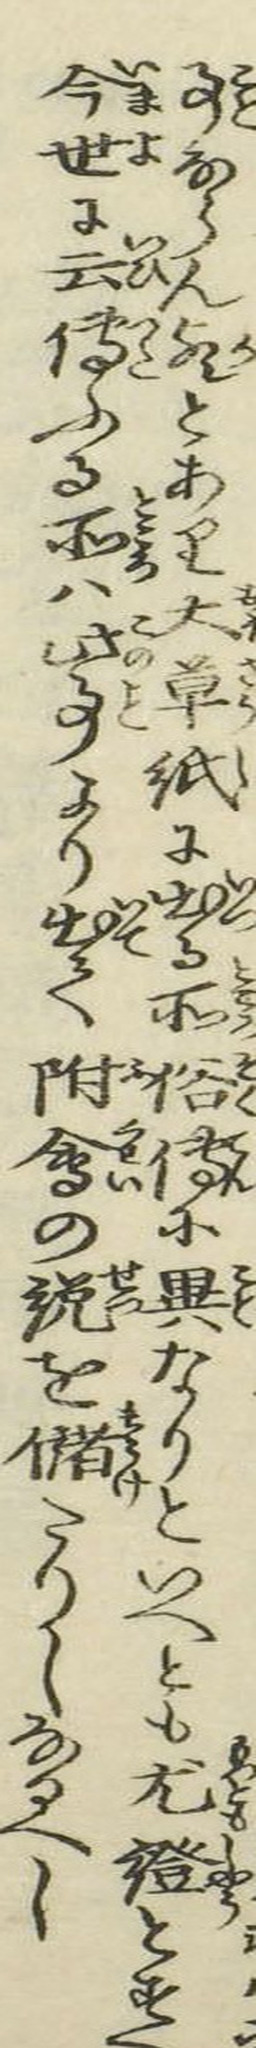今世に云傳ふる所は此事より出て附會の説を儲たりしなるへし
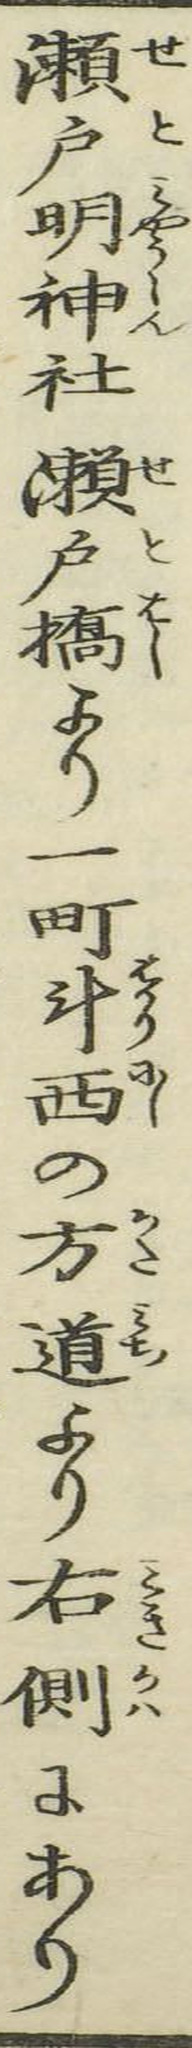瀬戸明神社瀬戸橋より一町斗西の方道より右側にあり
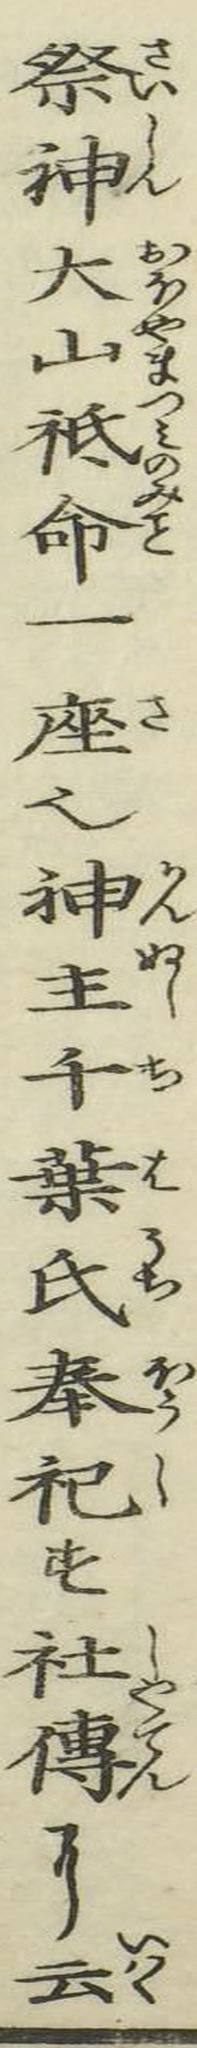祭神大山祗命一座也神主千葉氏奉祀す社傳に云
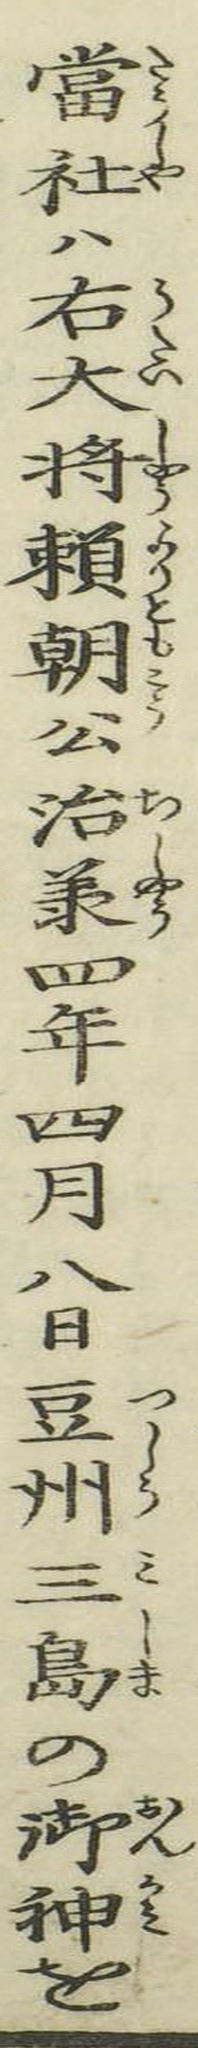當社は右大將頼朝公治承四年四月八日豆州三島の御神を
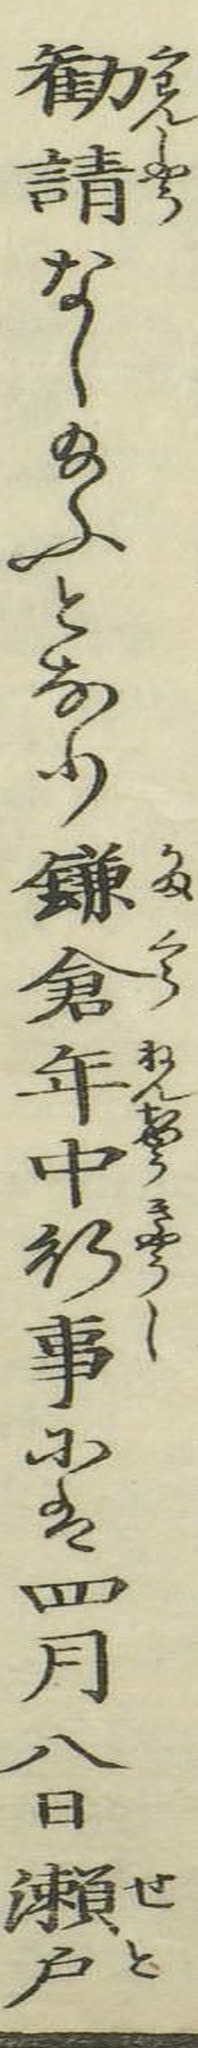勧請なし給ふとなり鎌倉年中行事には四月八日瀬戸
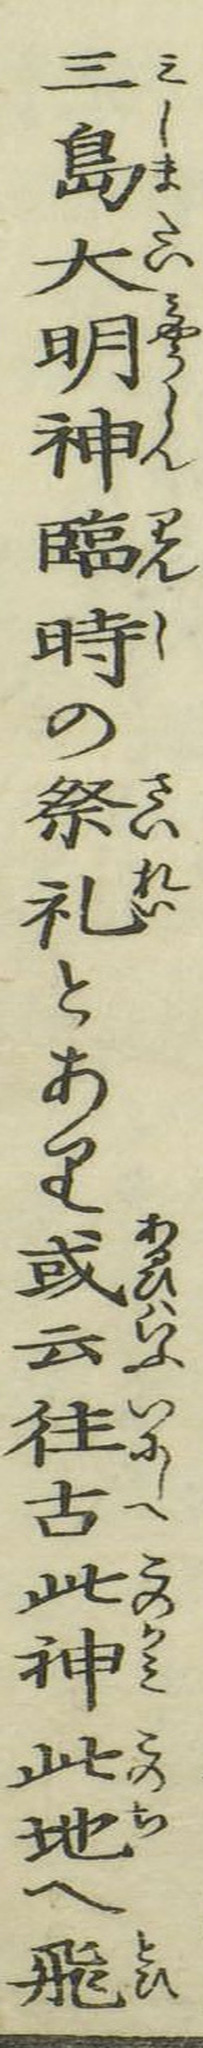三島大明神臨時の祭礼とあり或云往古此神此地へ飛

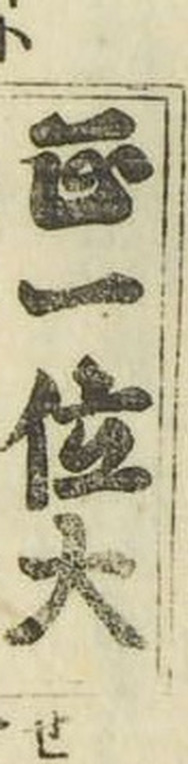正一位大
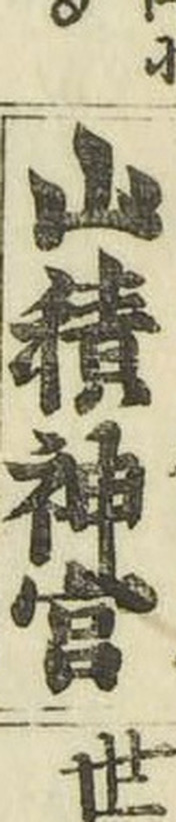山積神宮
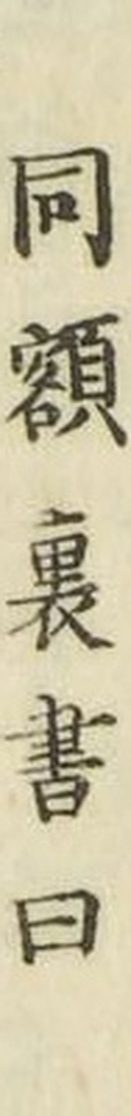同額裏書曰
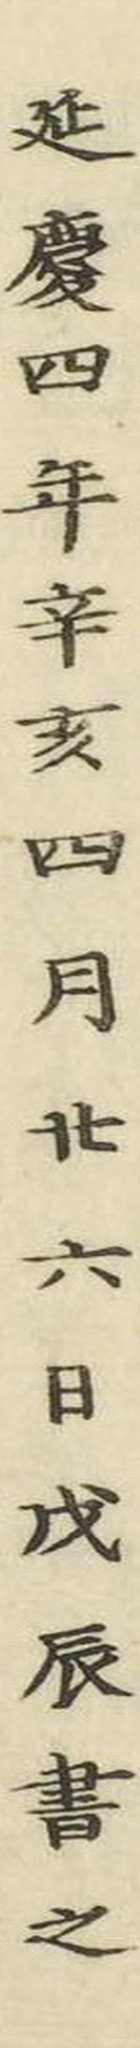延慶四年辛亥四月廿六日戊辰書之
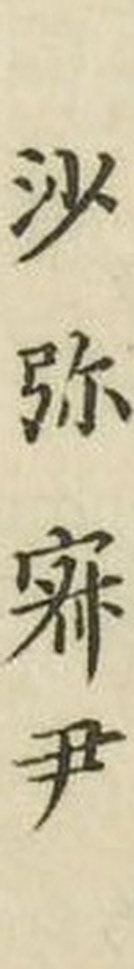沙弥𡨜尹
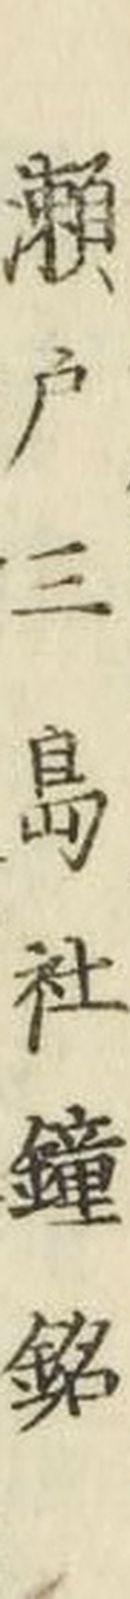瀬戸三島社鐘銘
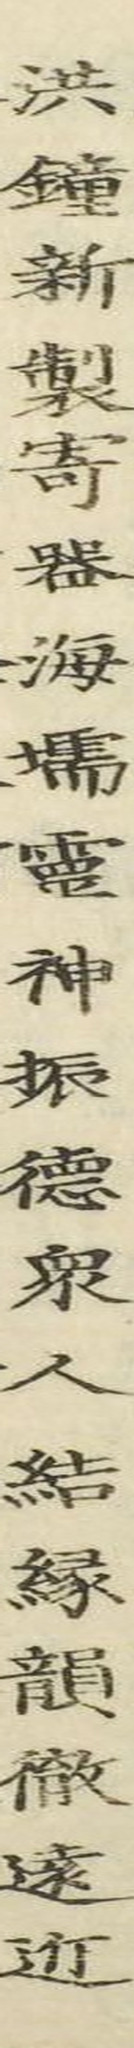洪鐘新製寄器海壖靈神振德衆人結縁韻徹遠近
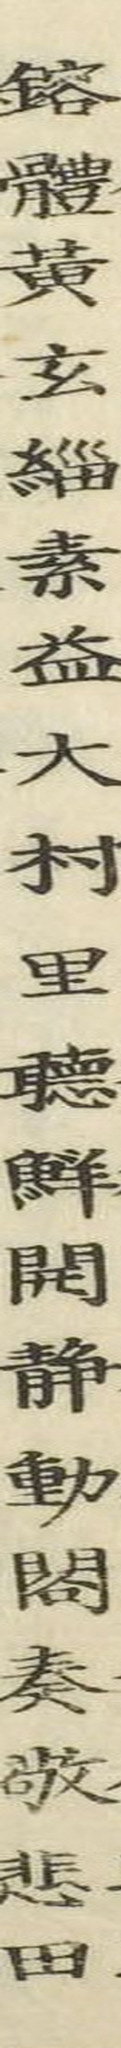鎔體黄玄緇素益大村里聽鮮開静動閣奏敬悲田
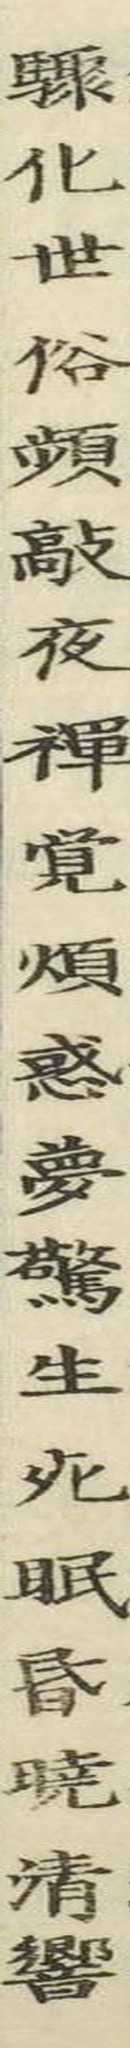驟化世俗頻敲夜禪覚煩惑夢驚生死眠昬暁清響
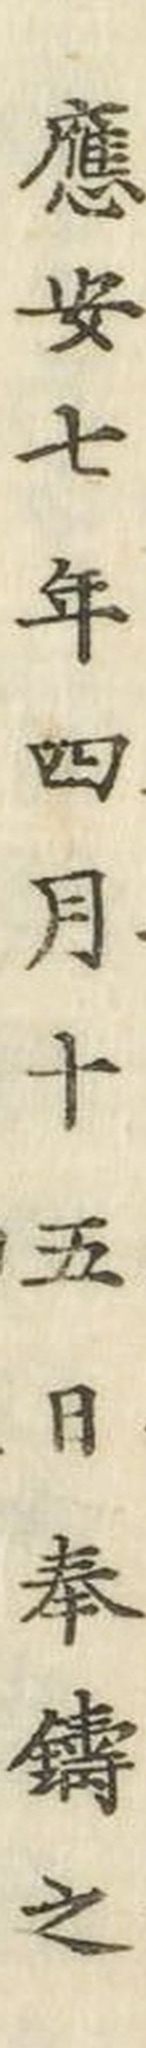應安七年四月十五日奉鑄之
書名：江戸名所図会 20巻 巻之6
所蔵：東京学芸大学教育コンテンツアーカイブ
